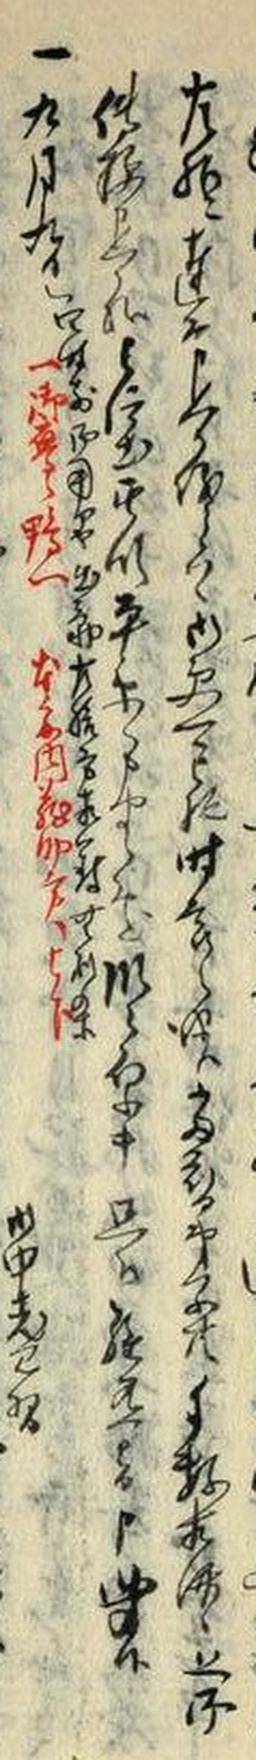伝授申上候様被仰出其段平兵衛へ申聞候処段々厚キ思召難有旨申聞候
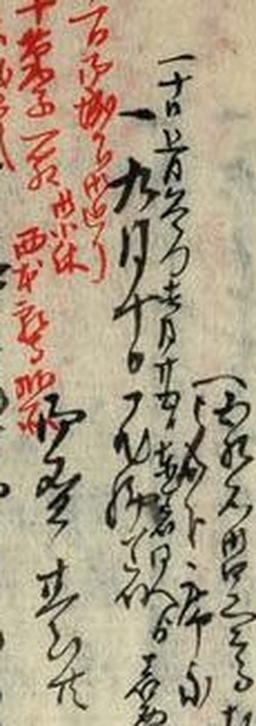一九月十日飛脚着
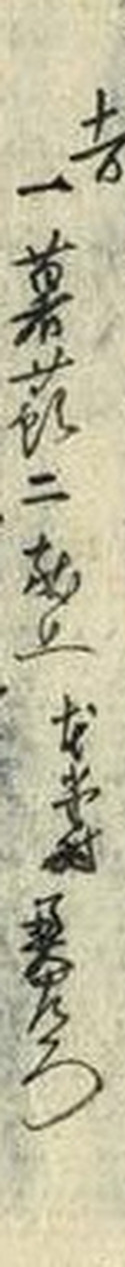一薯蕷二献上本堂村奥左衛門
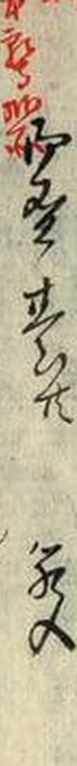御盃台共箱入
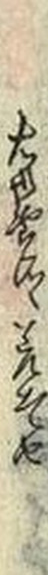右御台所へ差出候由
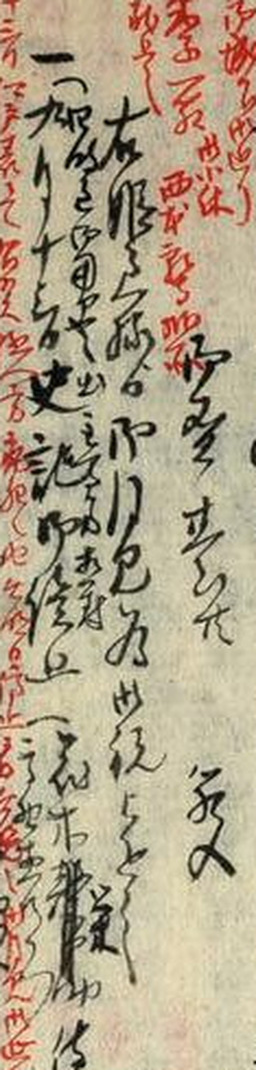右姫君様ゟ御月見為御祝被進之
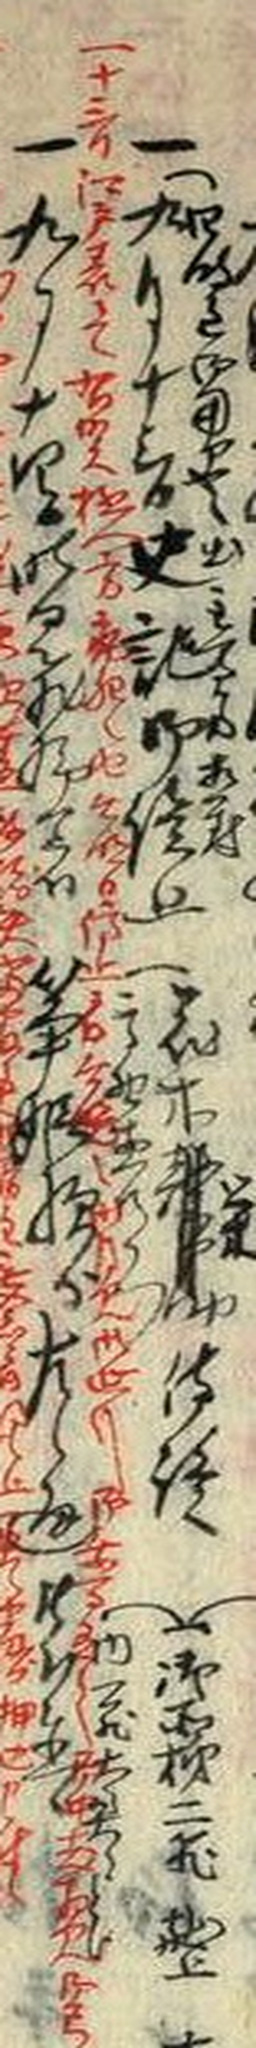一九月十四日昨日飛脚着箏姫様ゟ左之通被下置候
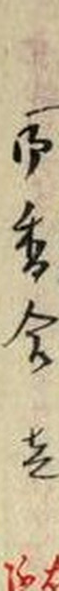御香合壱

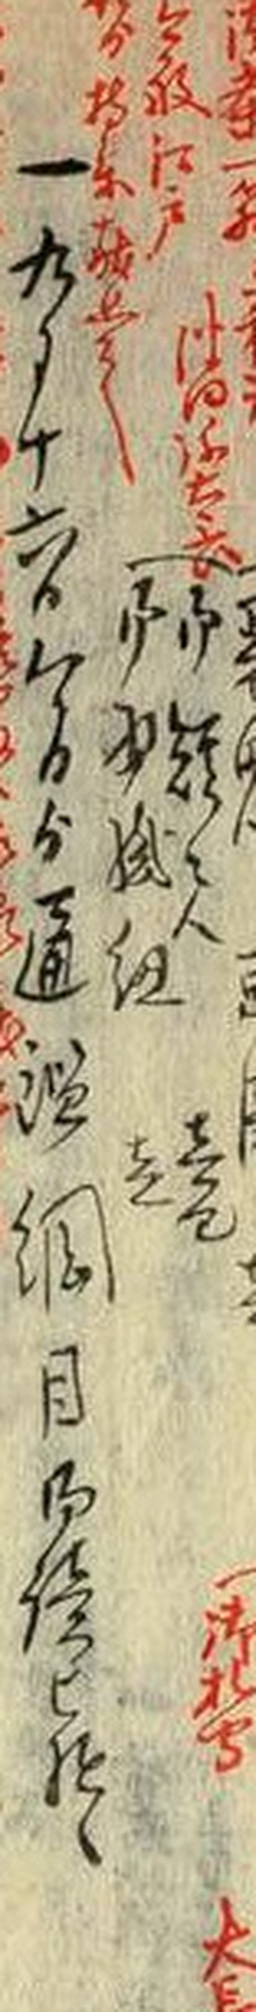一九月十六日今日ゟ通鑑綱目御読被遊候
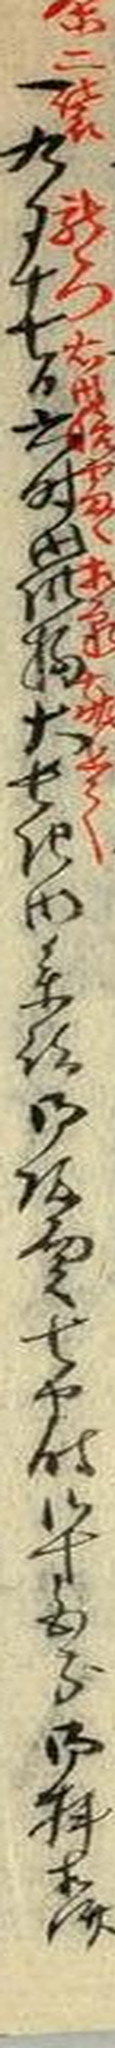一九月十七日六時御供揃大長院御参詣御帰殿七半時弐寸五分御拝相済
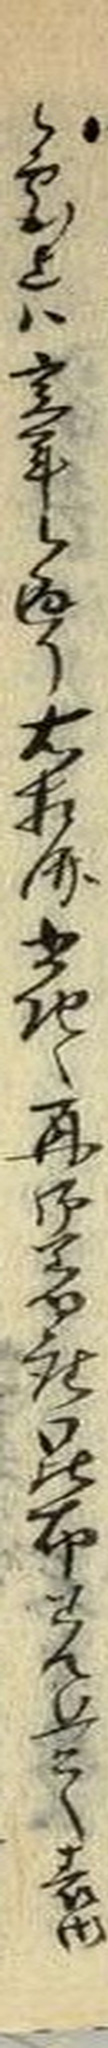候処迄ハ亥年之通り右相済書院へ再御着座昆布差上之表御
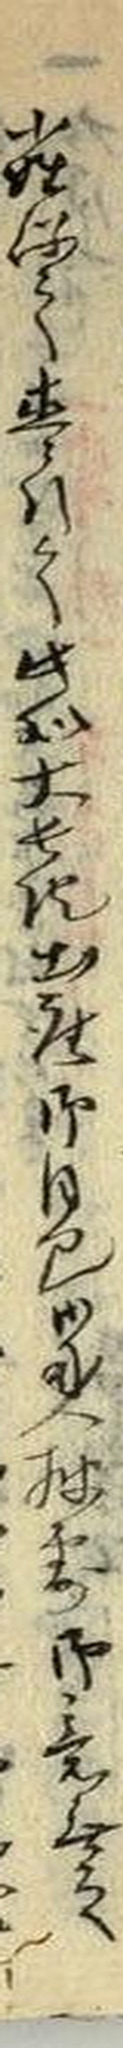小姓役之直ニ引之此処大長院出座御目見御用人披露御意無之
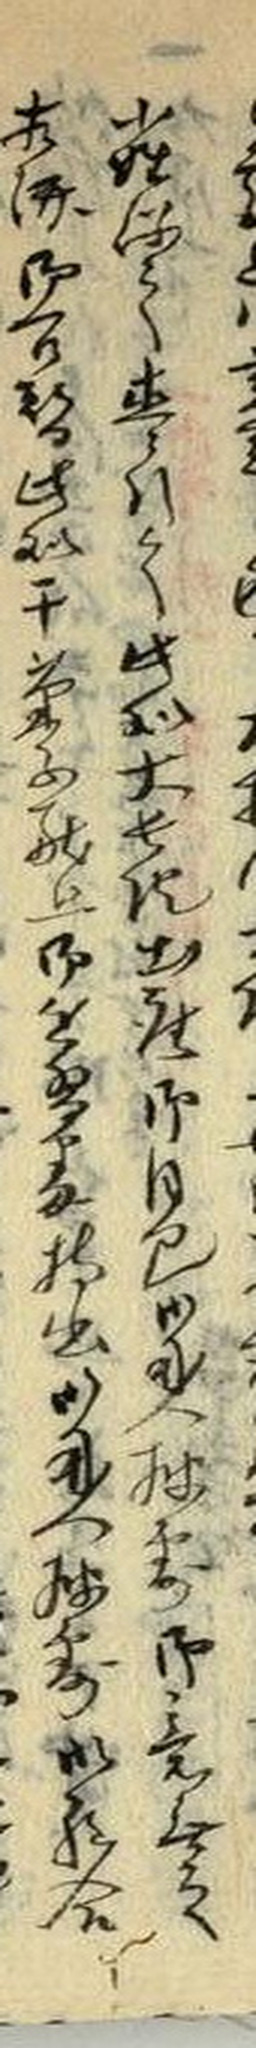相済御召替此処干菓子献上御近習番持出御用人披露御程合
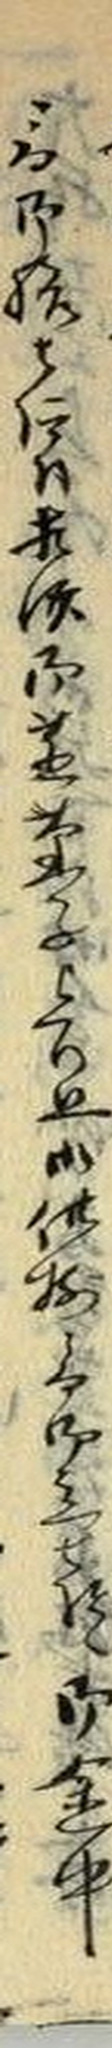ニ而御膳被仰付相済御蒸菓子被召上御供揃ニ而御立被遊候御途中
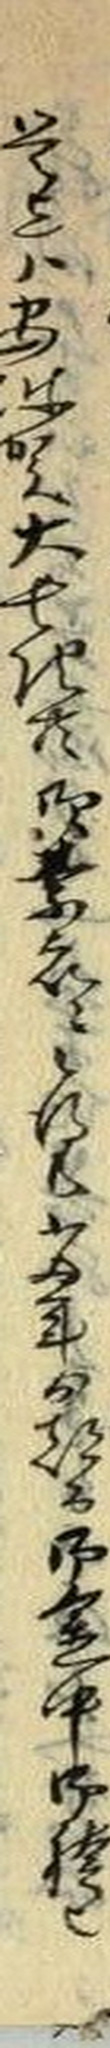是迄ハ安波賀大長院共御素衣二候得共当年ゟ都而御途中御袴被
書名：少傅日録抄（斉承付側向頭取日記、在国）
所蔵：福井県文書館 Fukui Prefectural Archives
